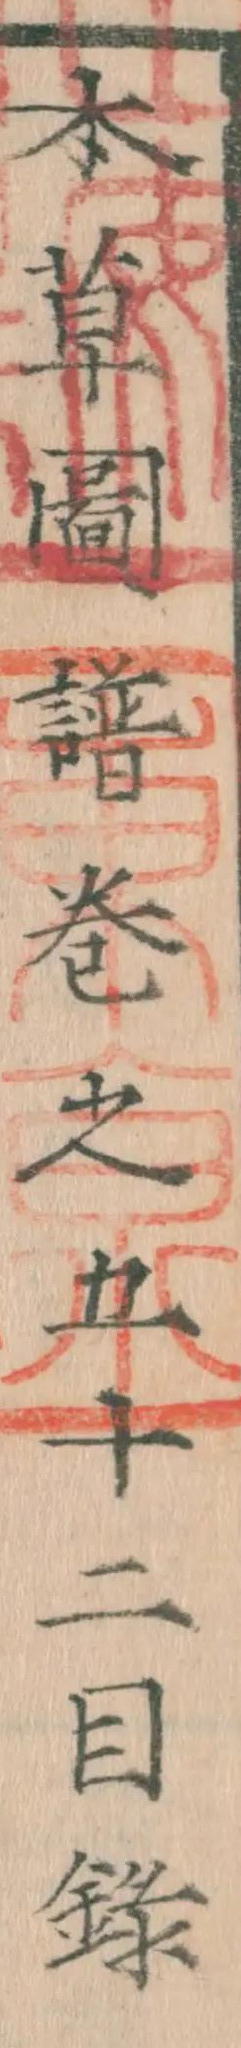本草図譜巻之五十二目録

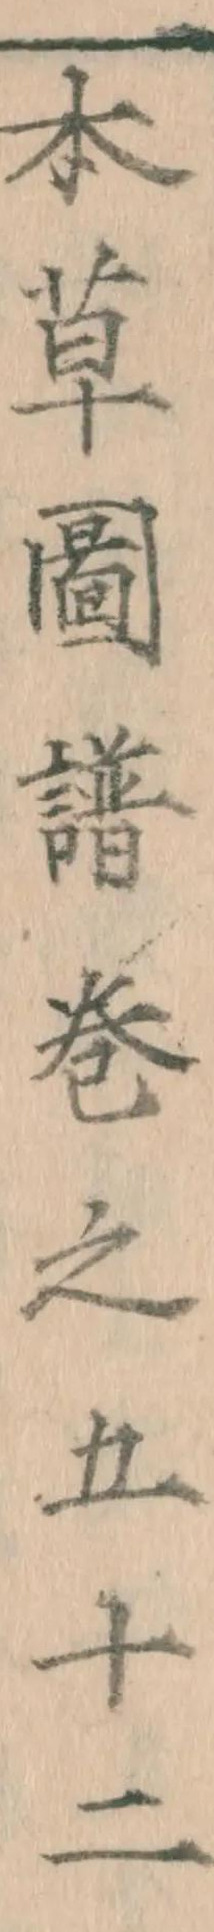本草図譜巻之五十二
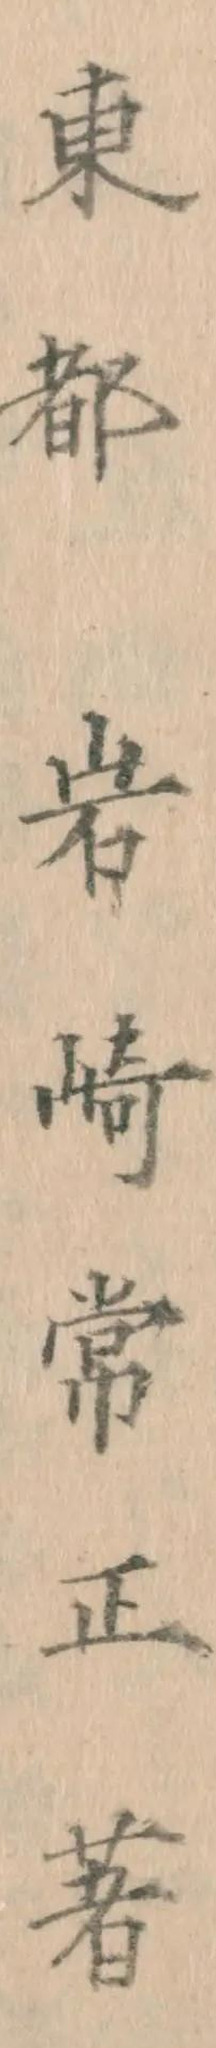東都岩崎常正著
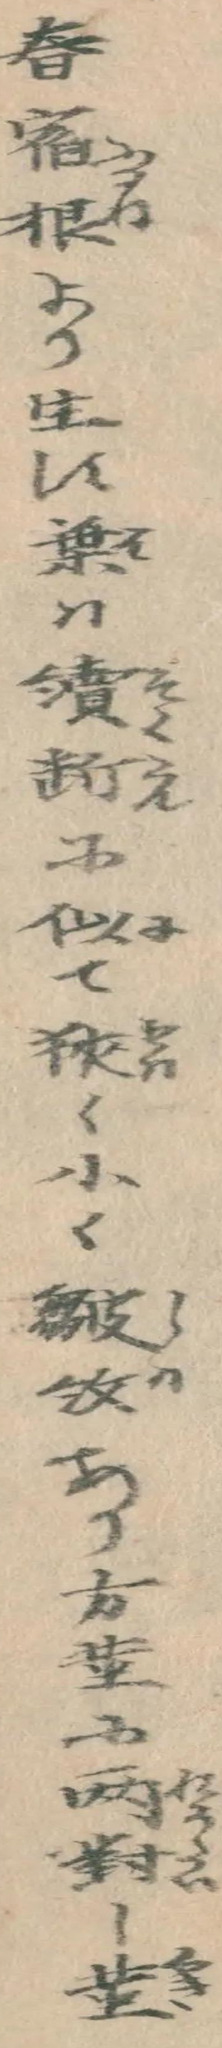春宿根より生す葉は続断に似て狭く小く皺紋あり方茎に両対し茎

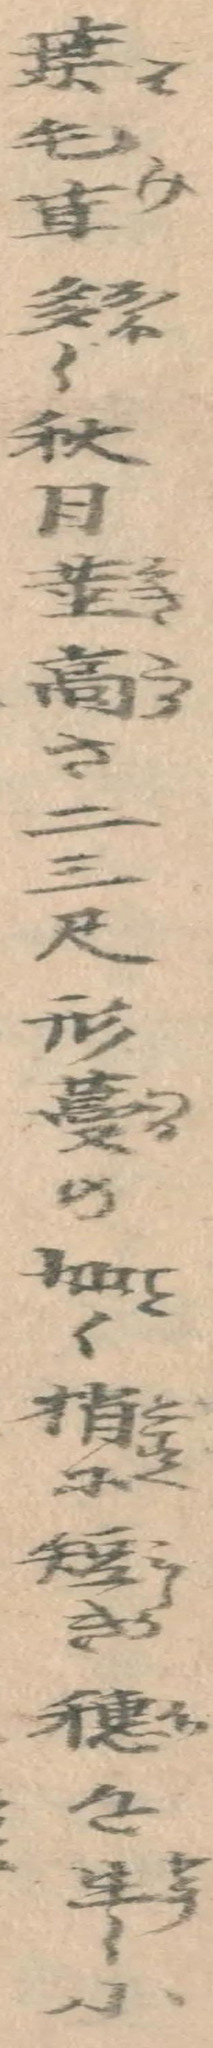葉毛茸多し秋月茎高さ二三尺形蔓の如く梢に短き穂を生し小
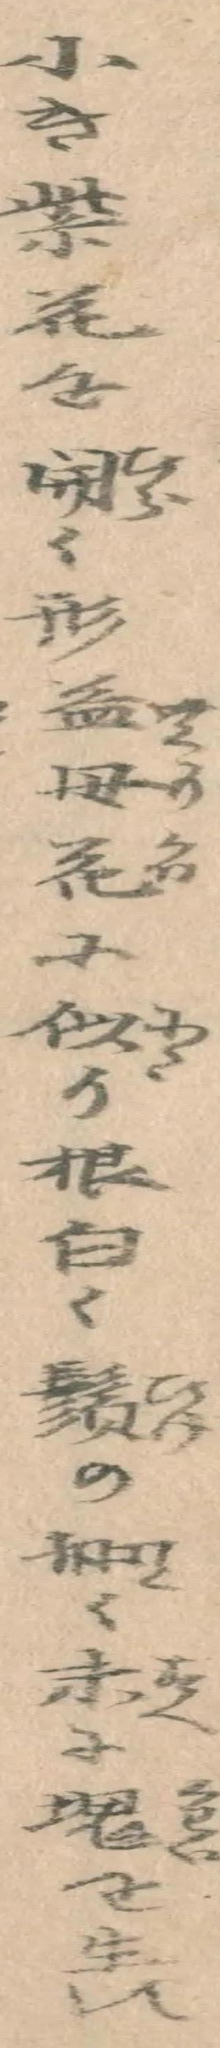小き紫花を開く形益母花に似り根白く鬚の如く末に塊を生す
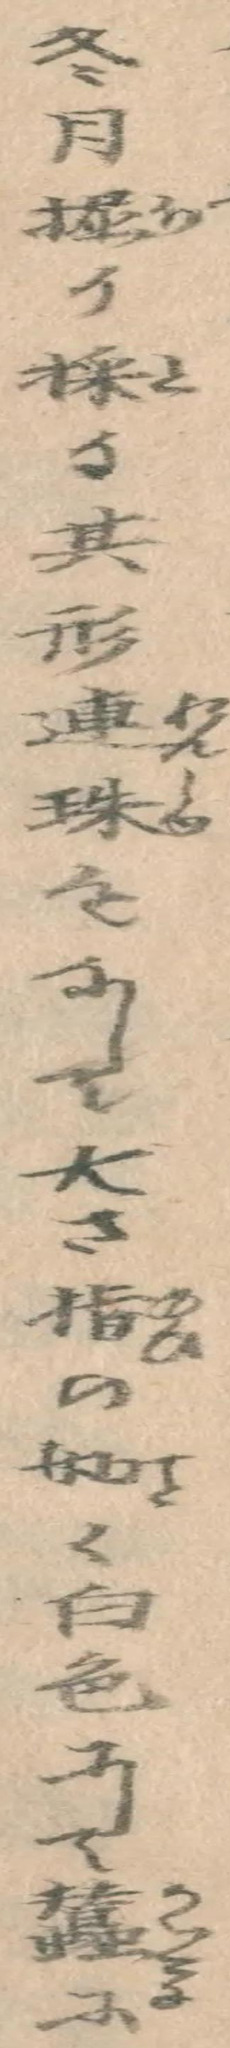冬月掘り採る其形連珠をなして大さ指の如く白色にして蚕に
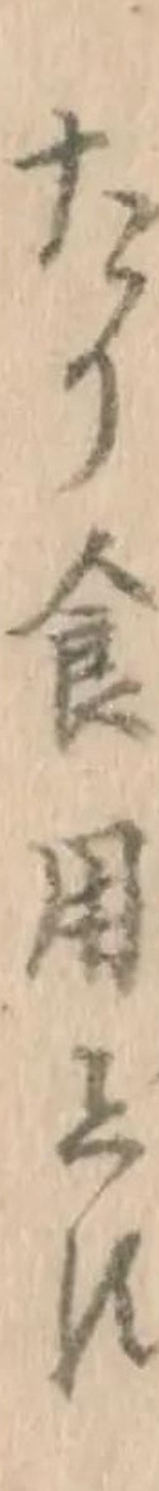たり食用とす
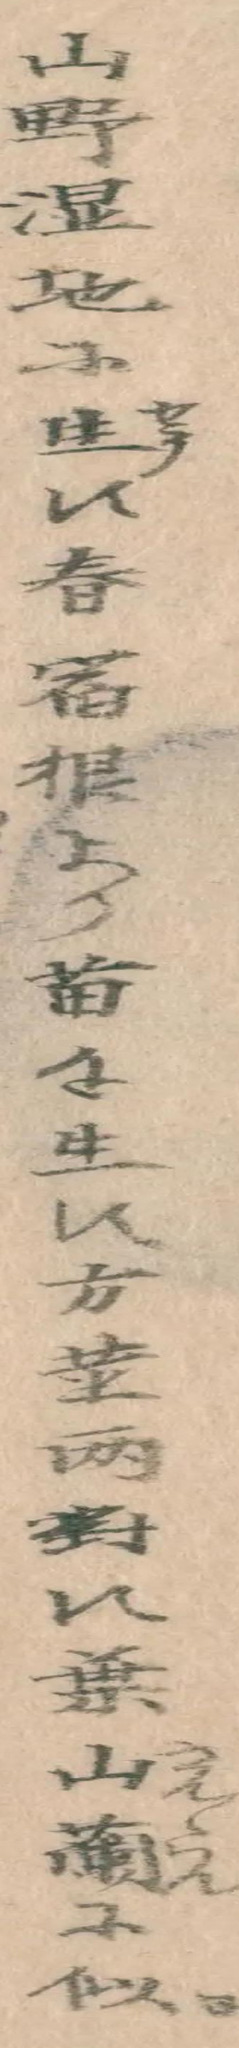山野湿地に生す春宿根より苗を生す方茎両対す葉山蘭に似
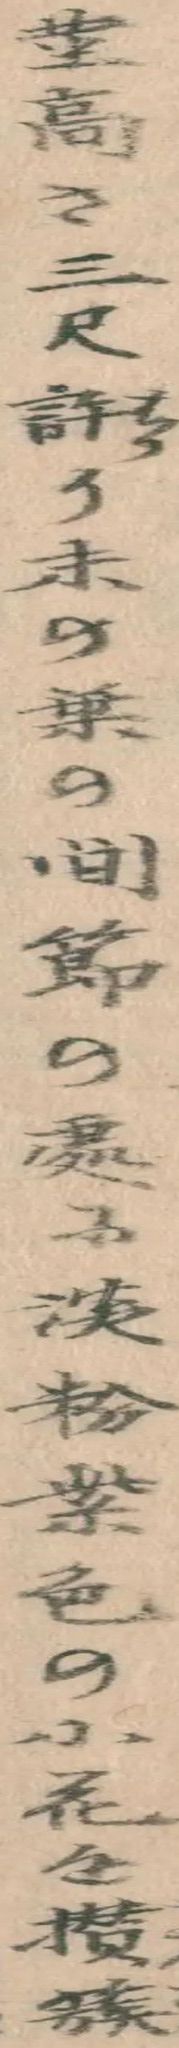茎高さ三尺許り末の葉の間節の処に淡粉紫色の小花を攢簇
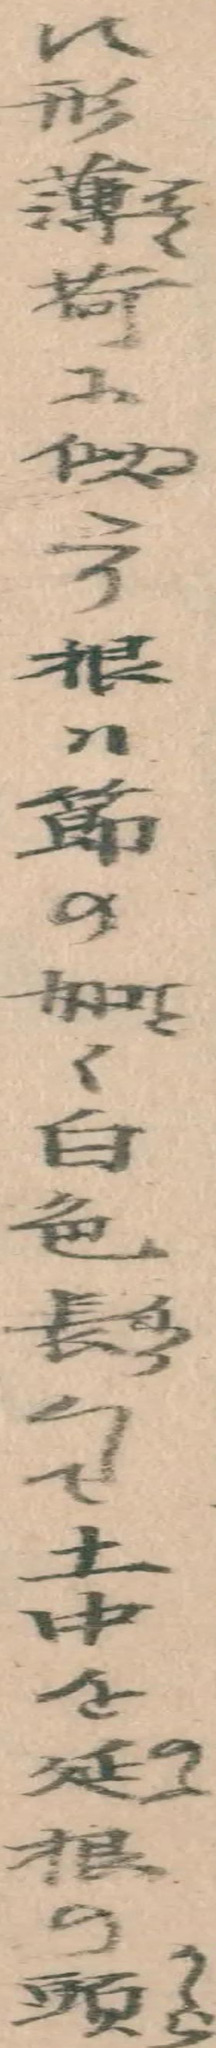す形薄荷に似たり根は節の如く白色長くして土中を延根の頭
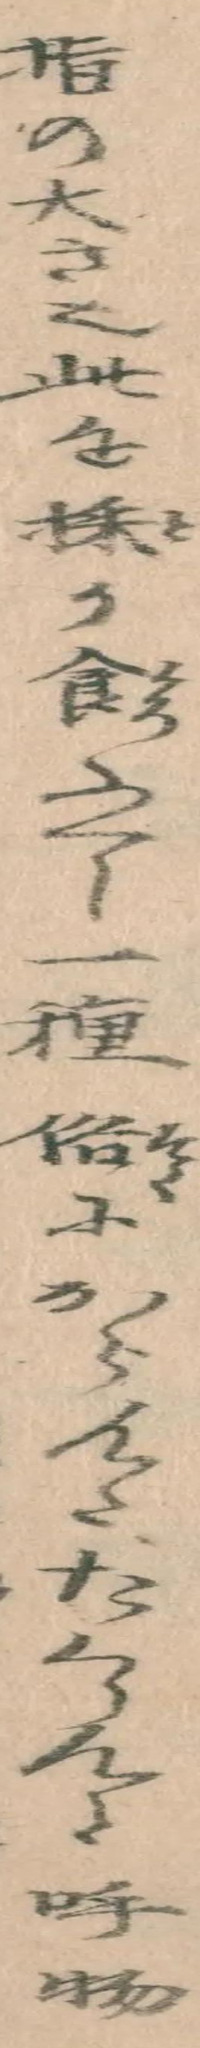指の大さ也此を採り食ふへし一種俗にからんた、たくしんと呼物
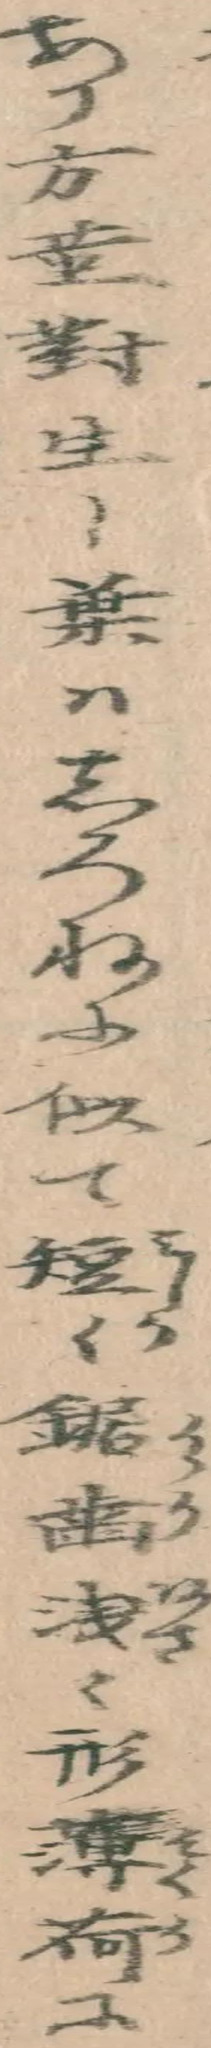あり方茎対生し葉はしろねに似て短く鋸歯浅く形薄荷に
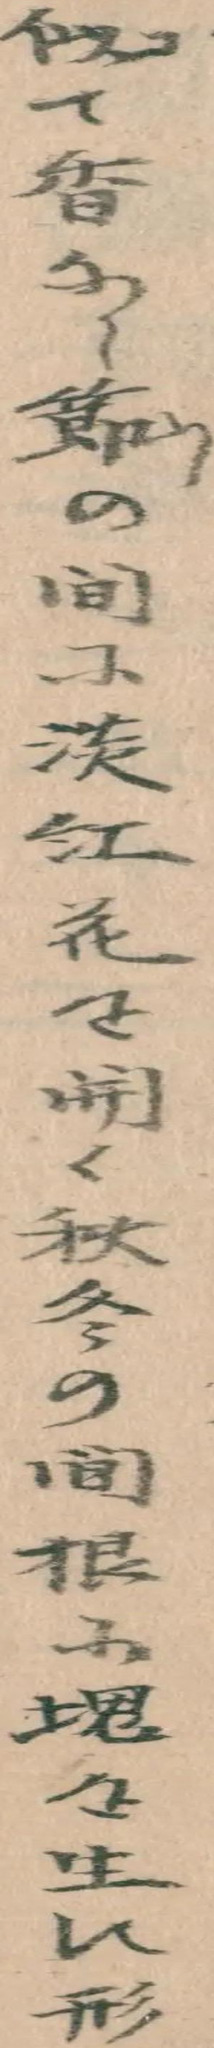似て香なし節の間に淡紅花を開く秋冬の間根に塊を生す形
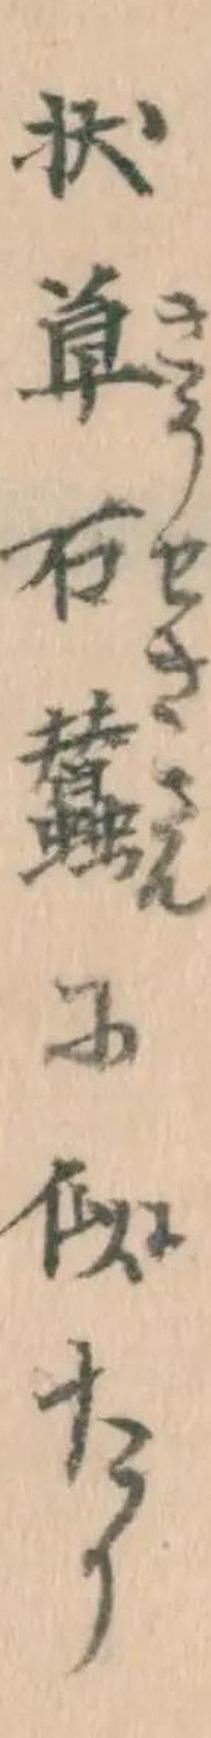状草石蚕に似たり

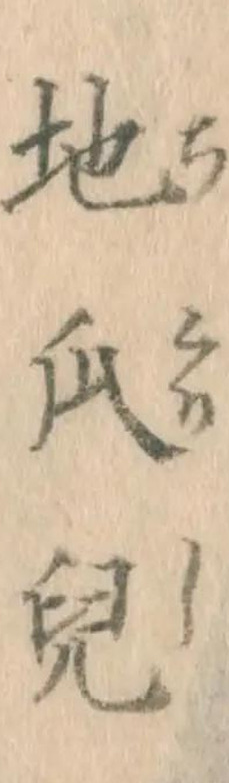地瓜児
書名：本草図譜. 巻52-54
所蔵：国立国会図書館 National Diet Library, JAPAN
